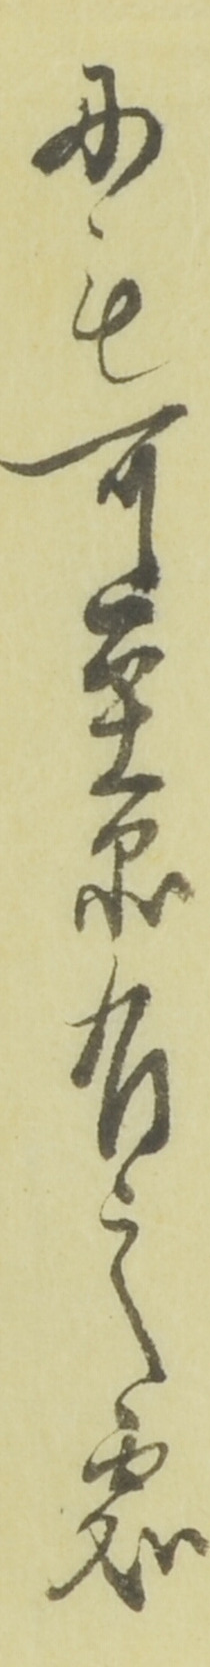にも可至品有之処
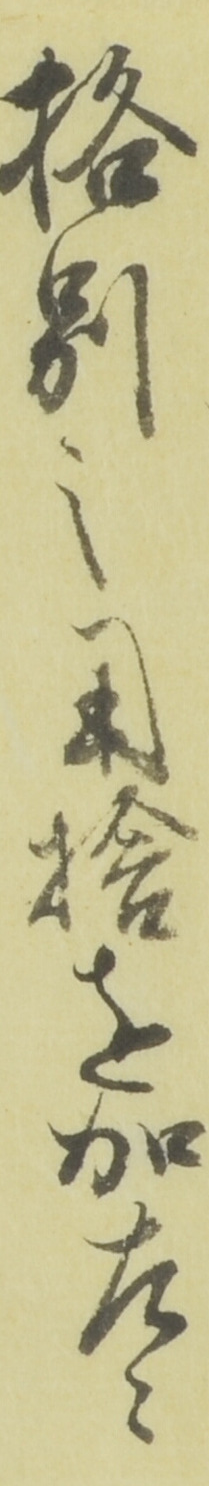格別之用捨を加左ニ
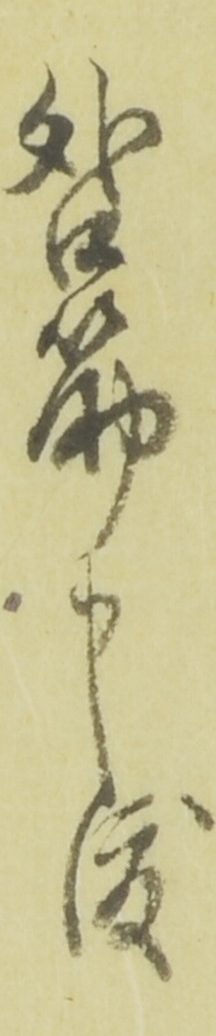咎筋申渡
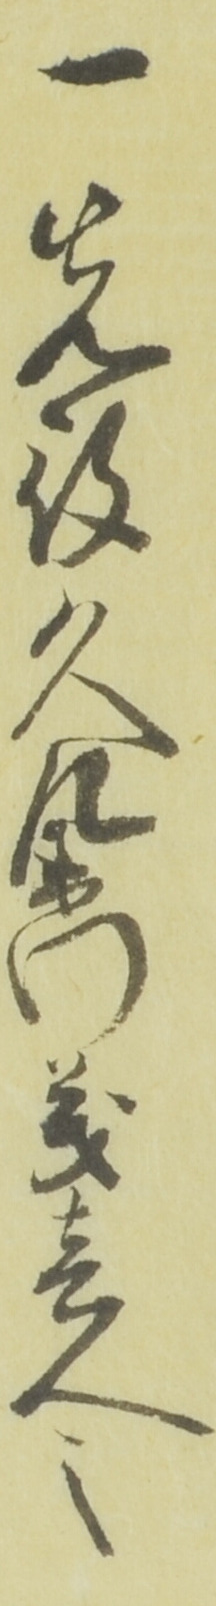一先役久左衛門義壱人之
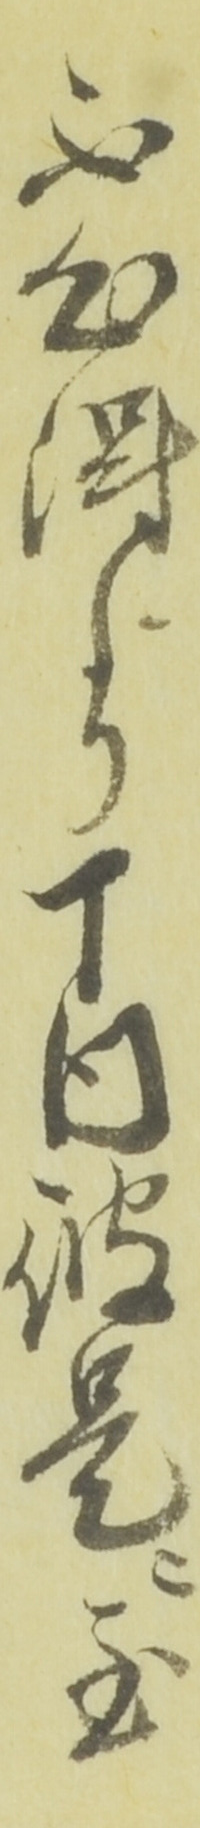不心得より丁内彼是ニ至
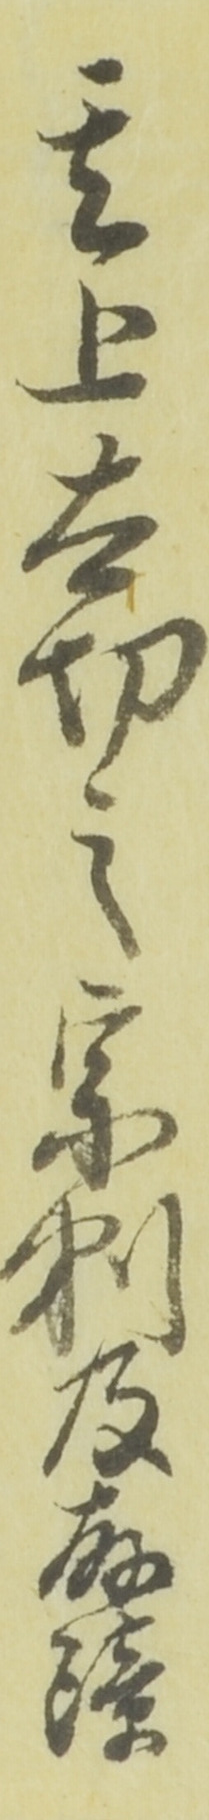其上太切之宗判及故障
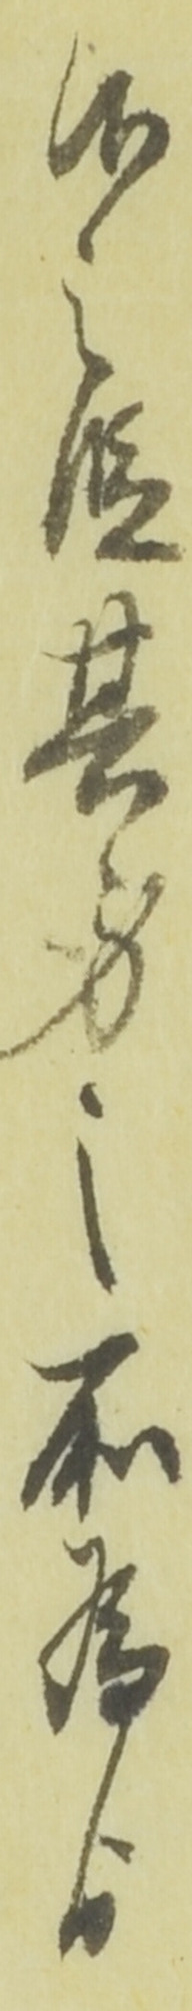候之段其身之所為ゟ
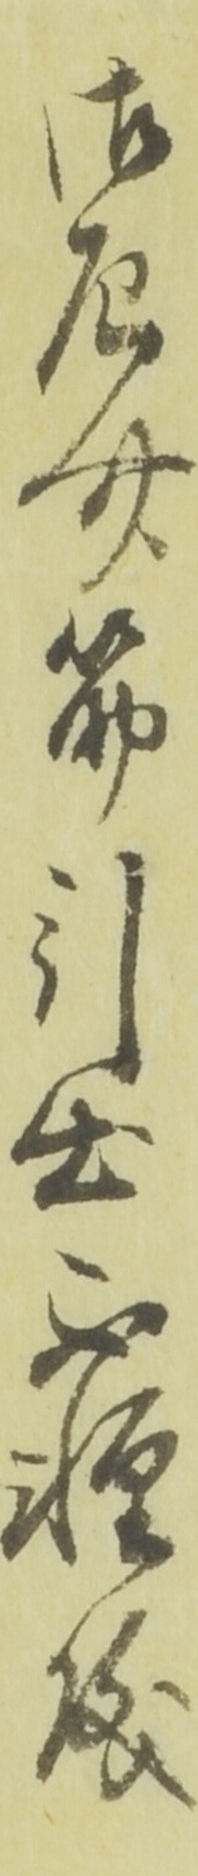御厄介筋引出不軽儀
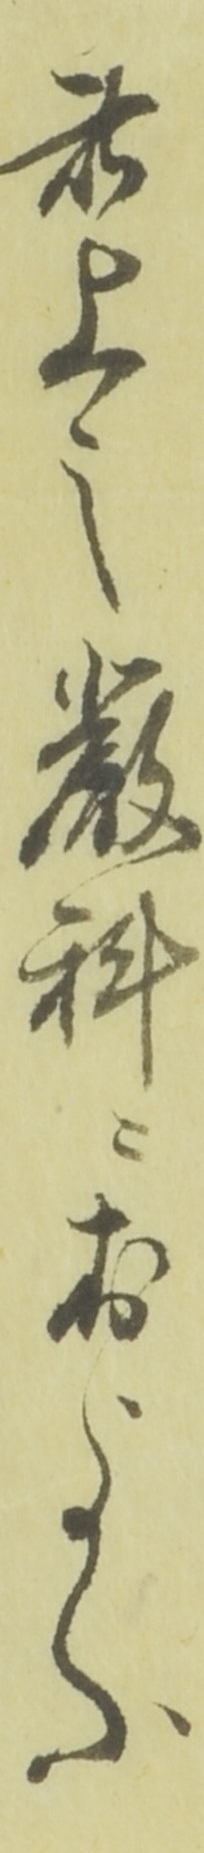此上之厳科ニおよふ
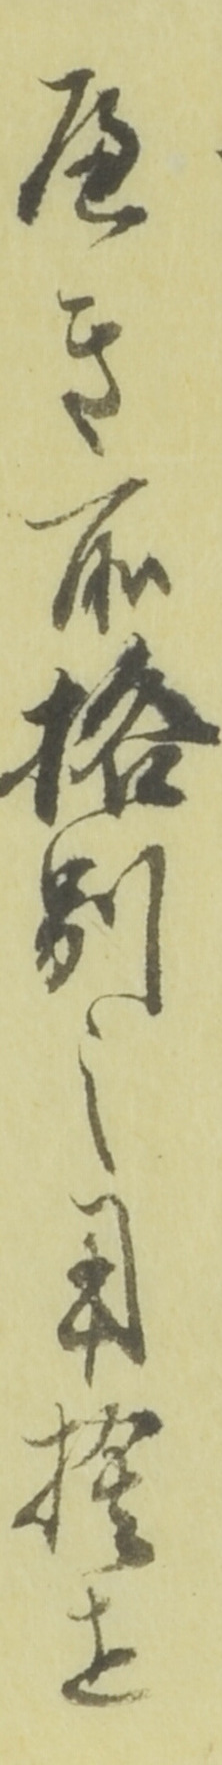へき所格別之用捨を
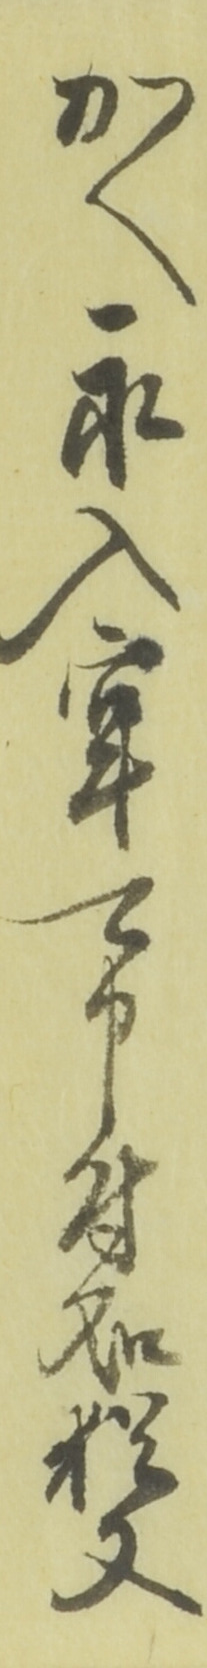加へ永入窂可申付処猶又
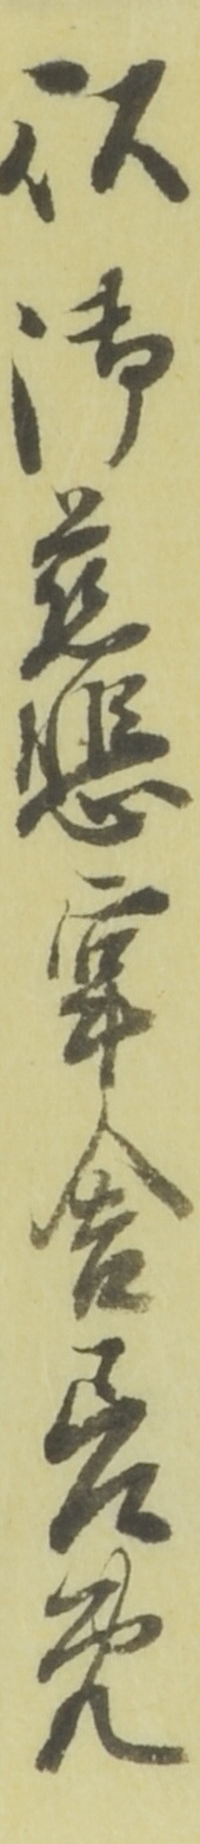以御慈悲窂舎差免
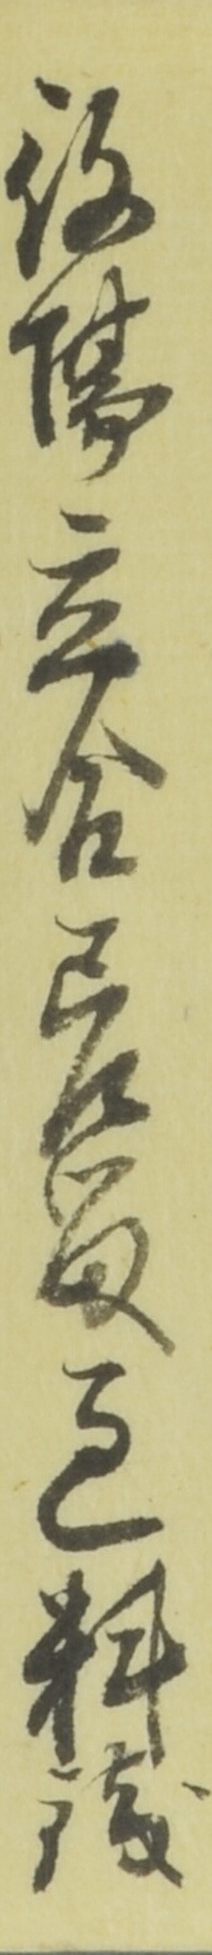役場立合差留過料銭
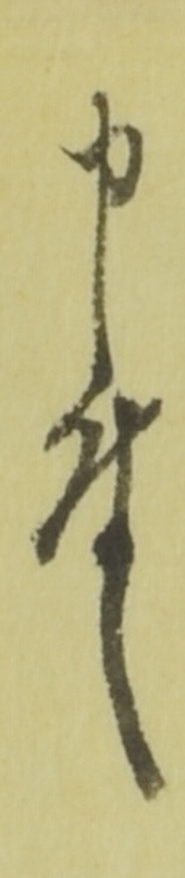申付候
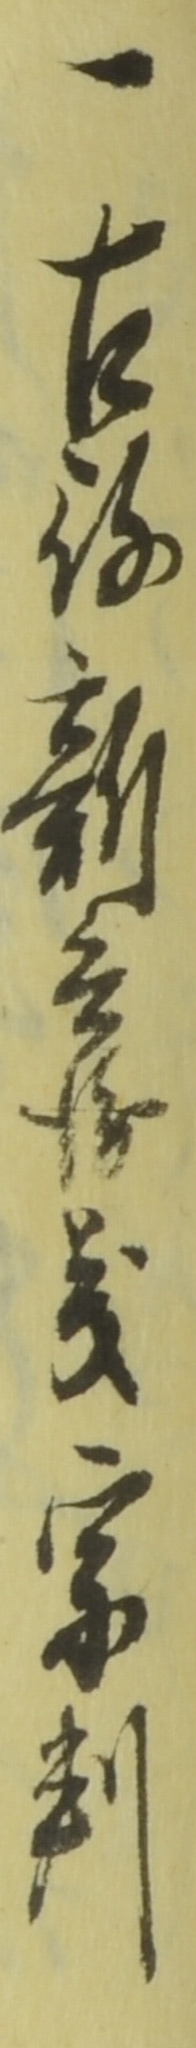一古役新兵衛義宗判
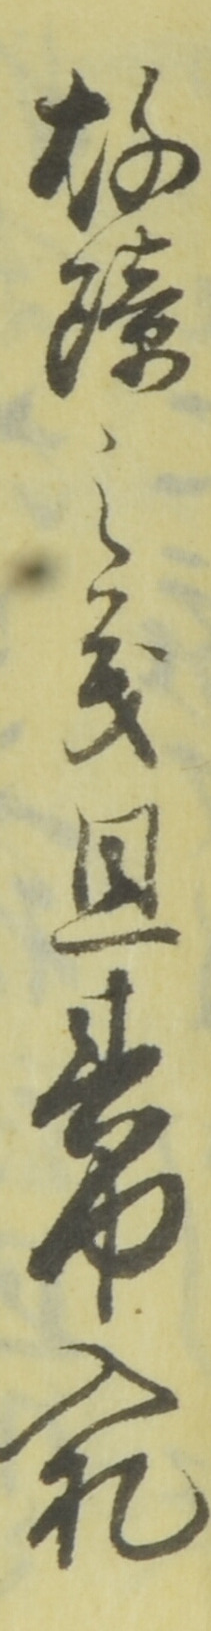故障之義且其中入札
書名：御触書御書附控
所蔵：伊那市立高遠町図書館・合同会社AMANE
